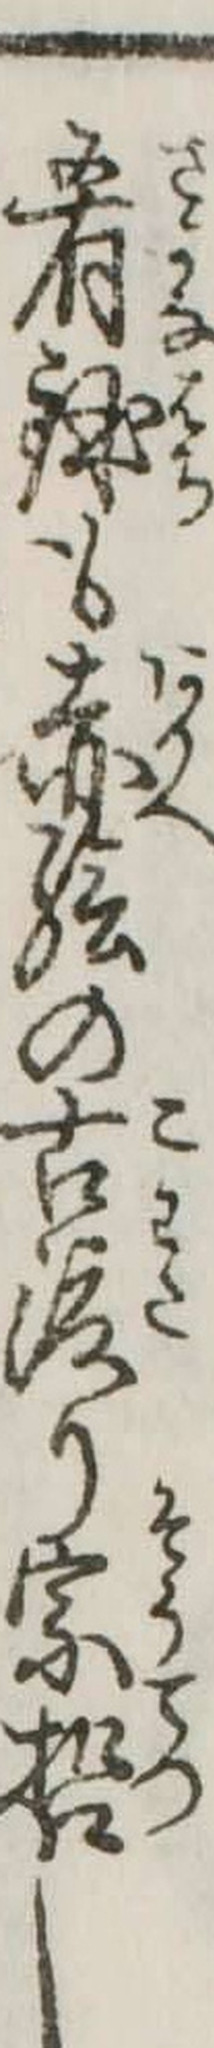肴鉢も赤絵の古渡り宗哲
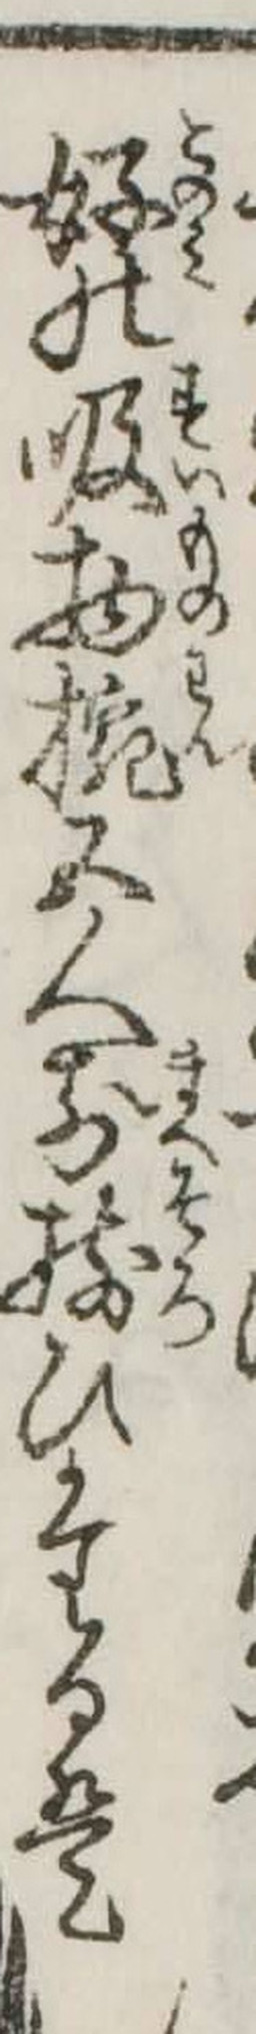好の吸物椀五人前揃ひたる是
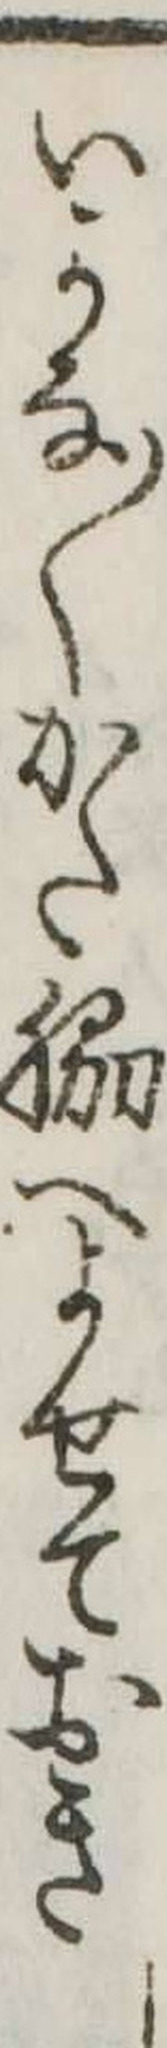いかな〳〵かた脇へよせておき
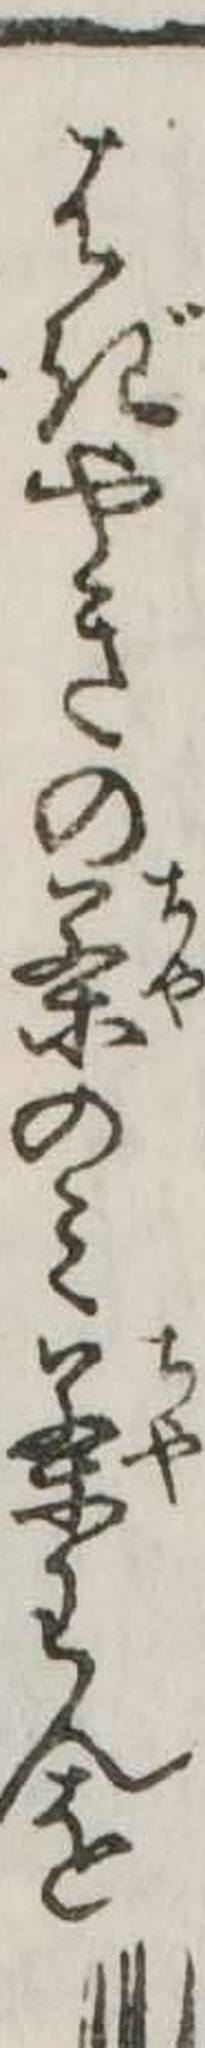はぎやきの茶のみ茶わんを
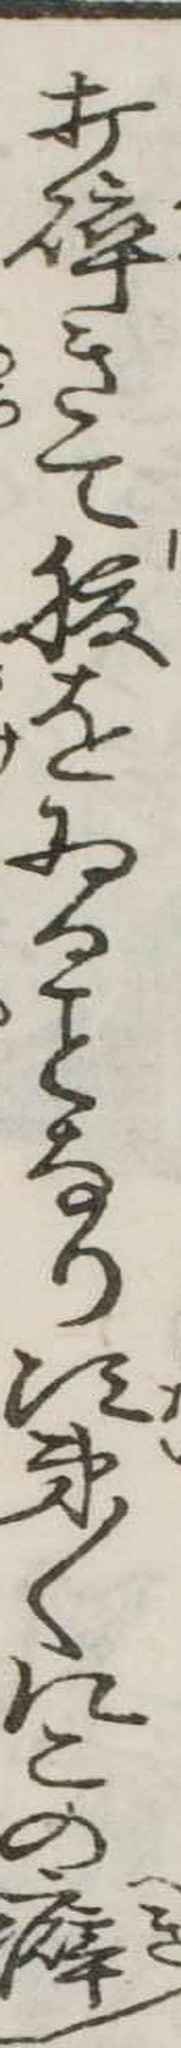打砕きて腹をゐることなり次第〳〵にこの癖
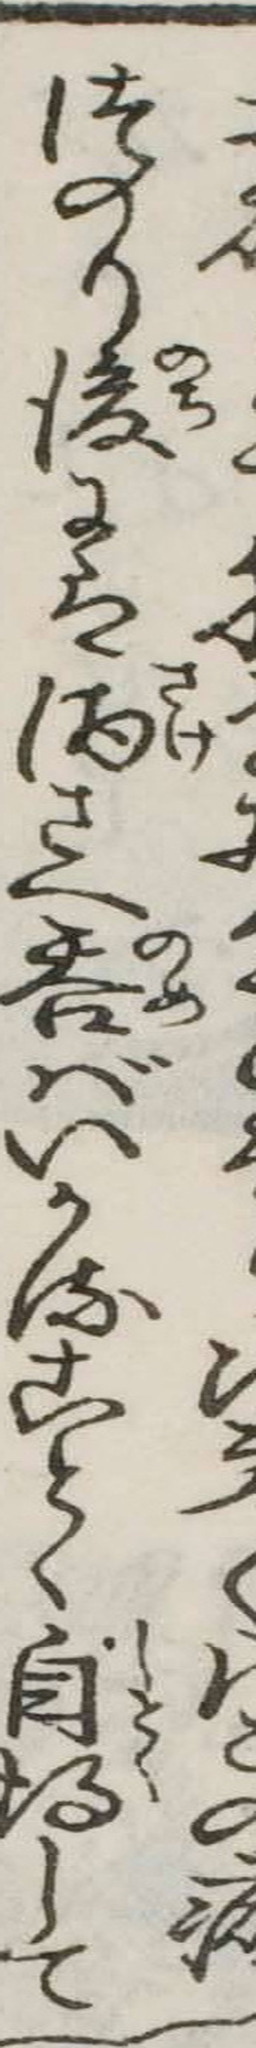つのり後には酒さへ吞ばいかることく自得して
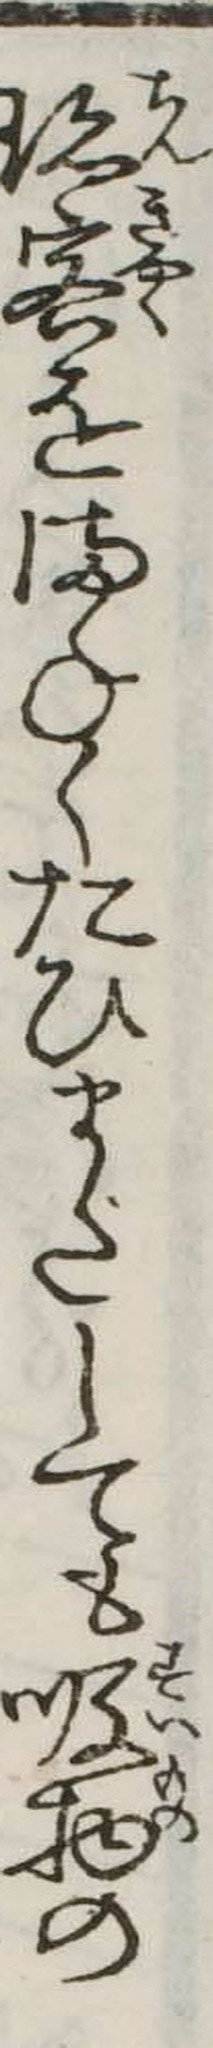珍客をまねくたひまたしても吸物の
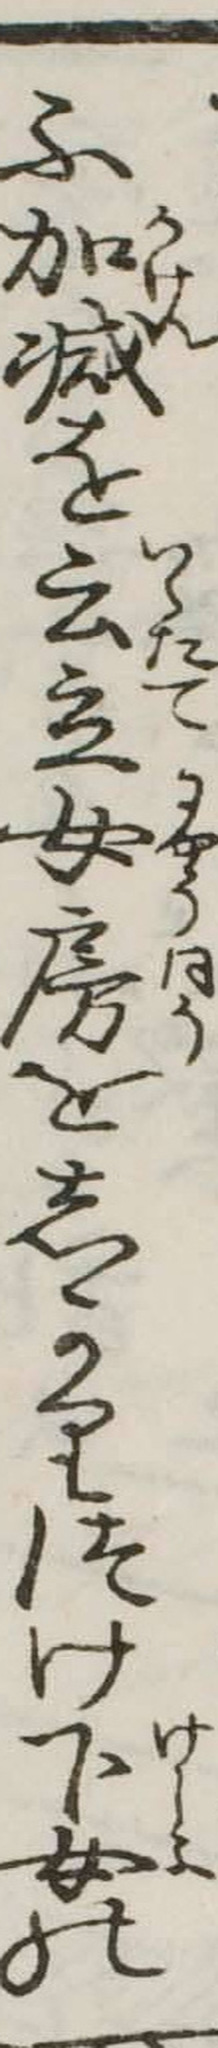ふ加減を云立女房をしかりつけ下女の
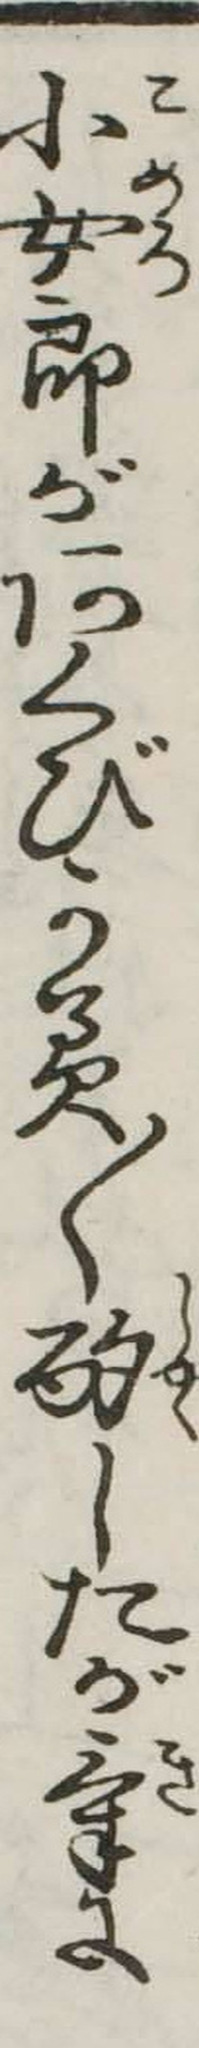小女郎があくびかみ〳〵酌したが気に
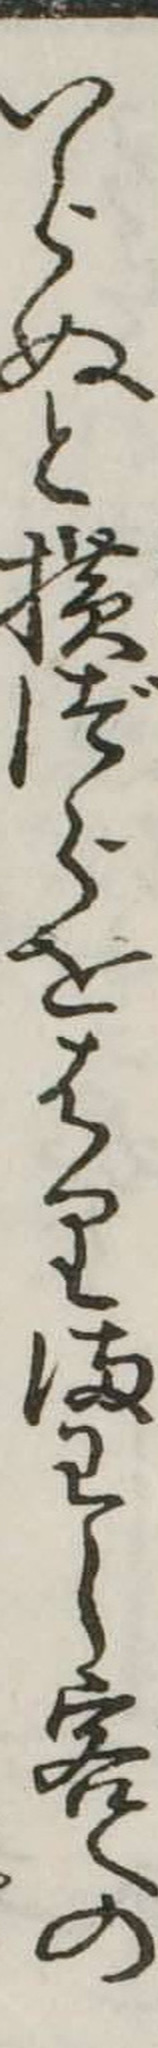いらぬと横づらをはりまわし客への
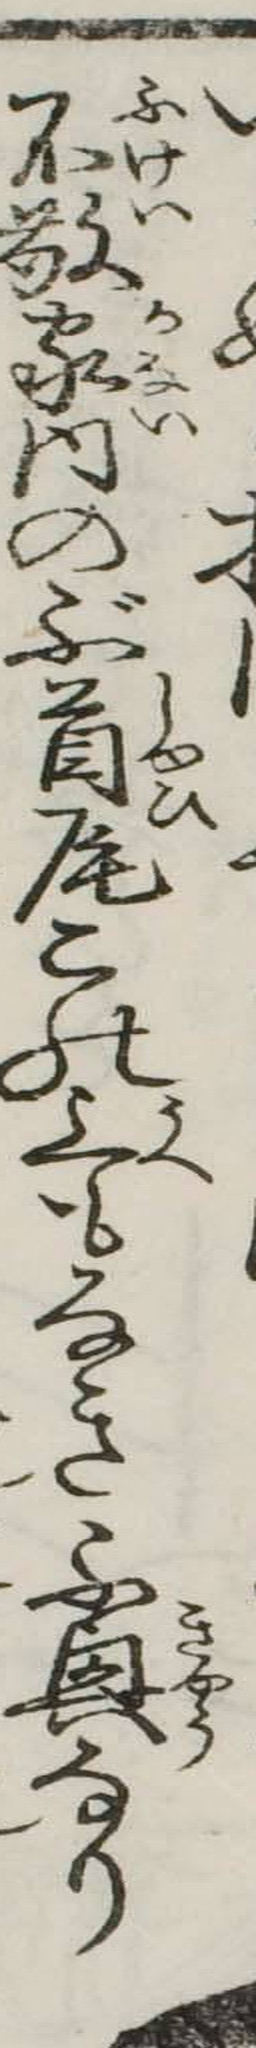不敬家内のぶ首尾この上もなきふ興なり
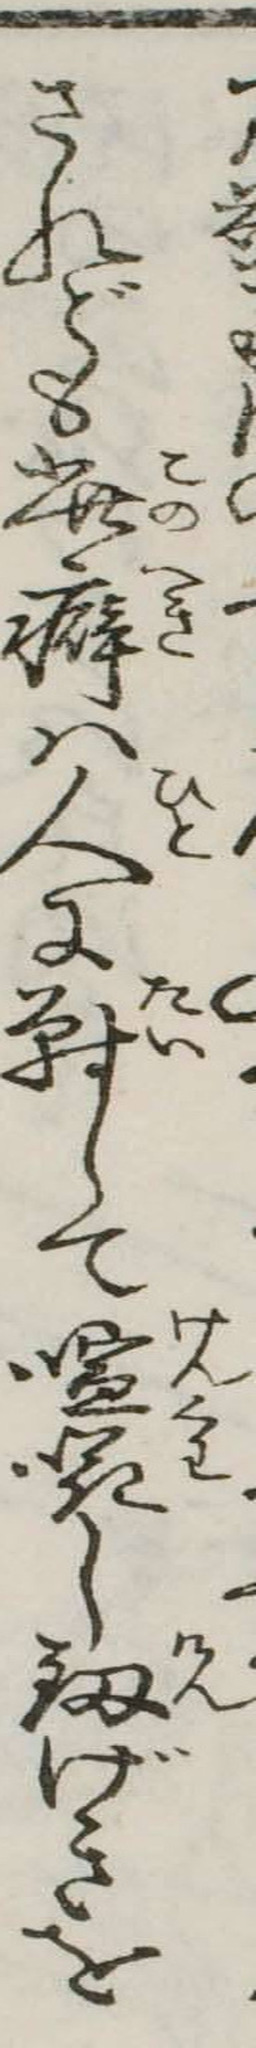されども此癖は人に対して喧嘩し釼げきを
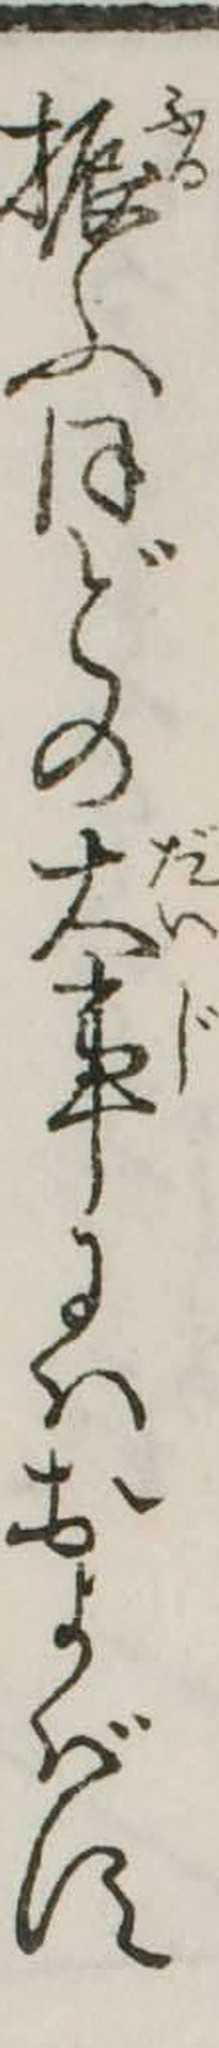振ふほどの大事にはおよばす
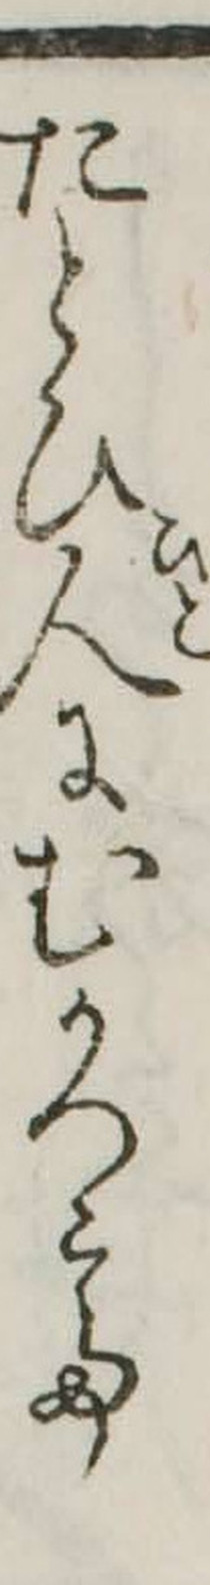たとひ人にむかつて
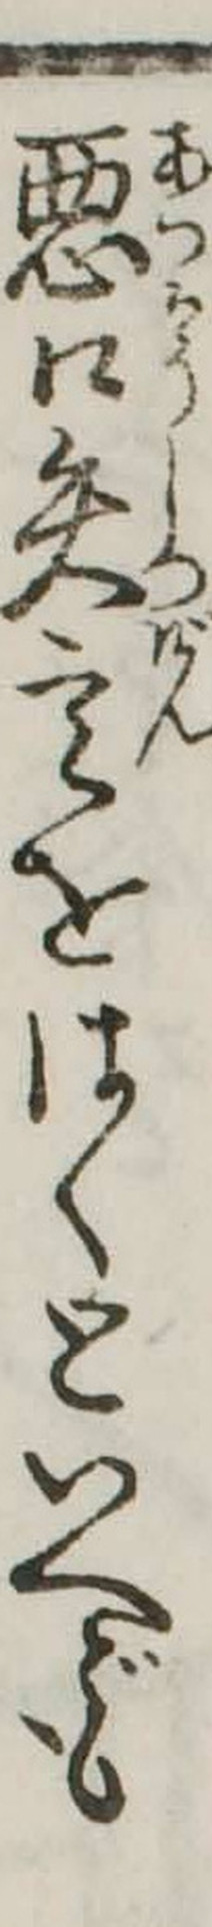悪口失言をはくといへども
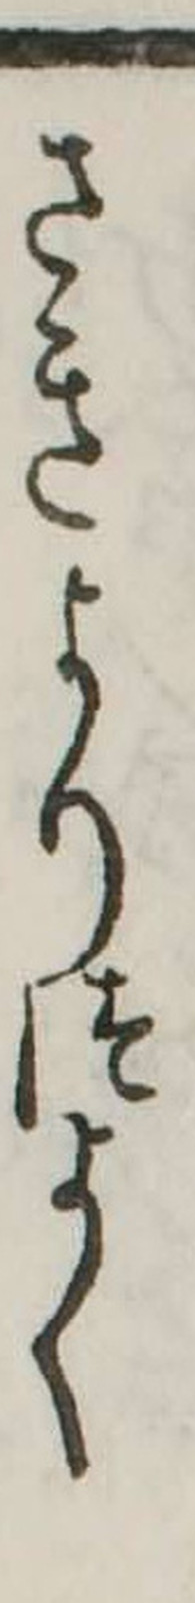さきよりつよく
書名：繪本不盡泉
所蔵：国文学研究資料館
